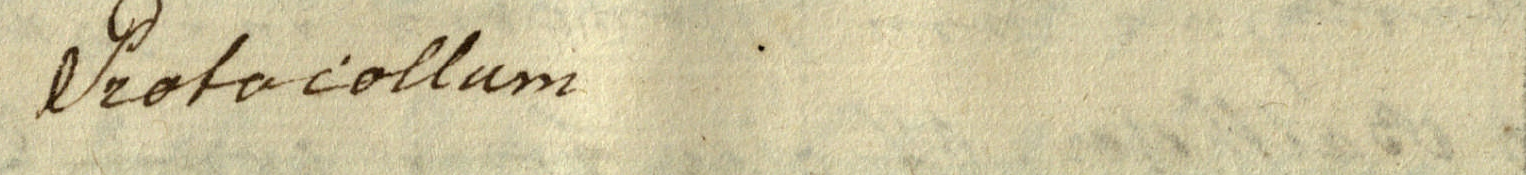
Protocollum
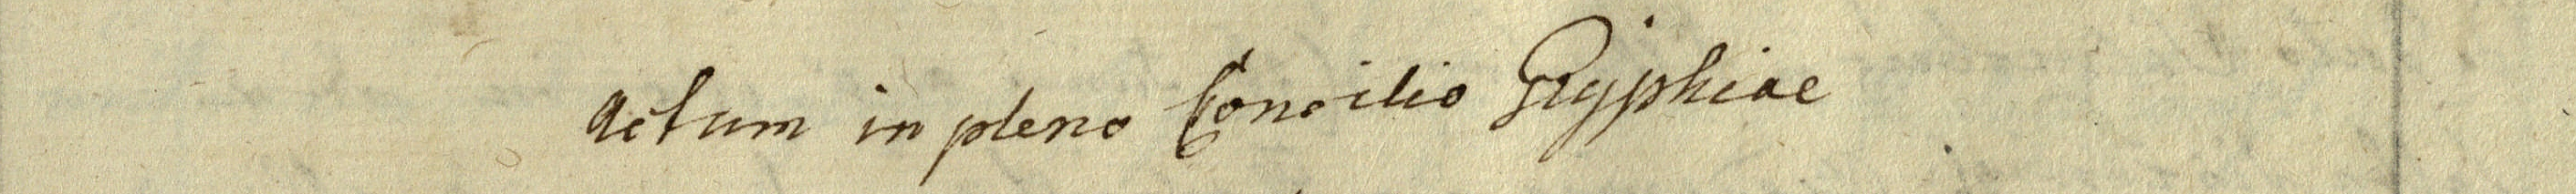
Actum in pleno Concilio Grÿphiae
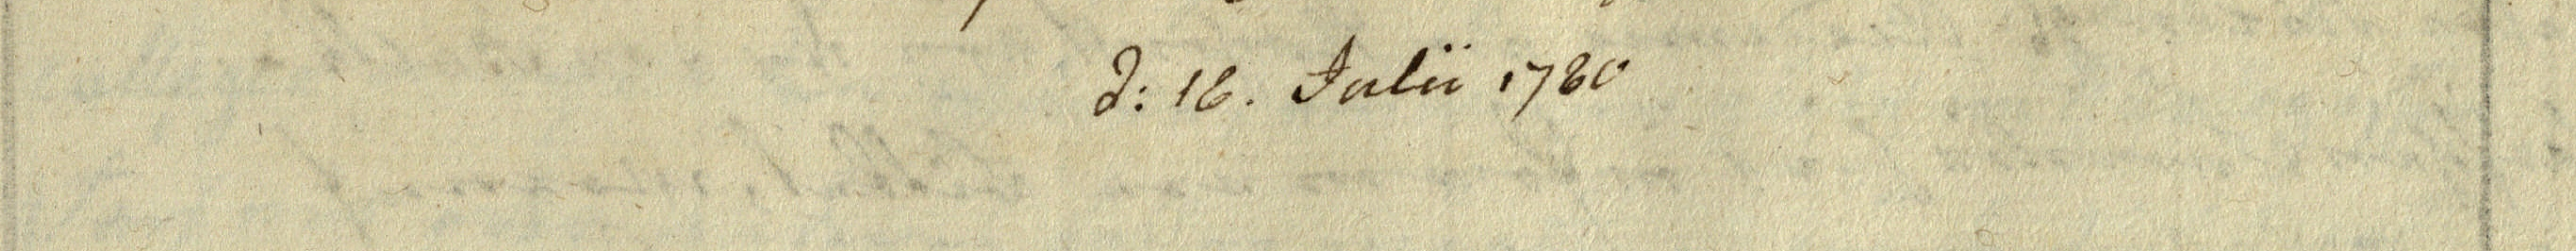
d. 18. Julii 1780
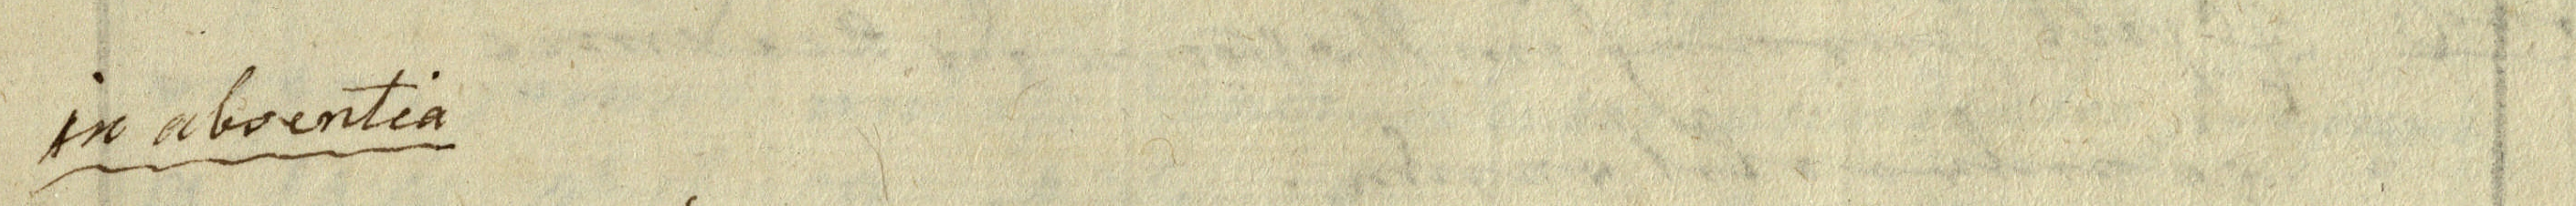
in absentia
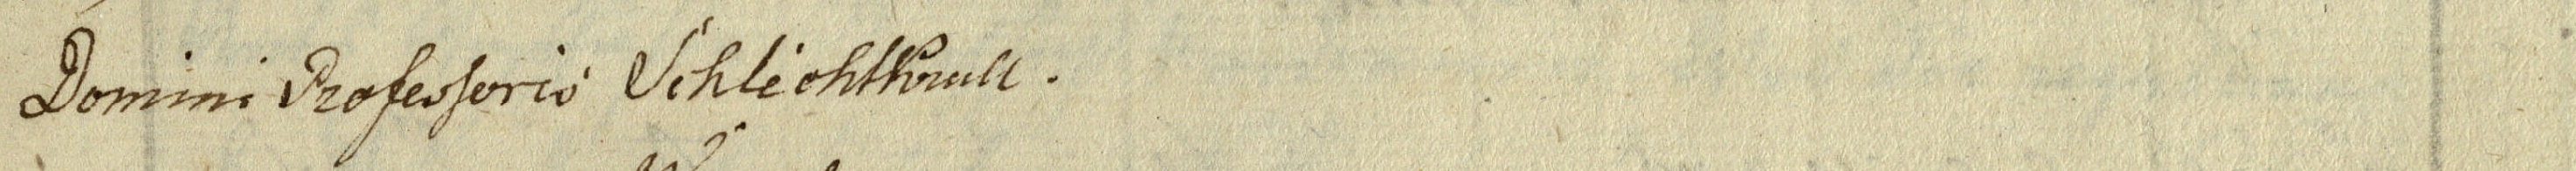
Domini Professoris Schlichtkrull.
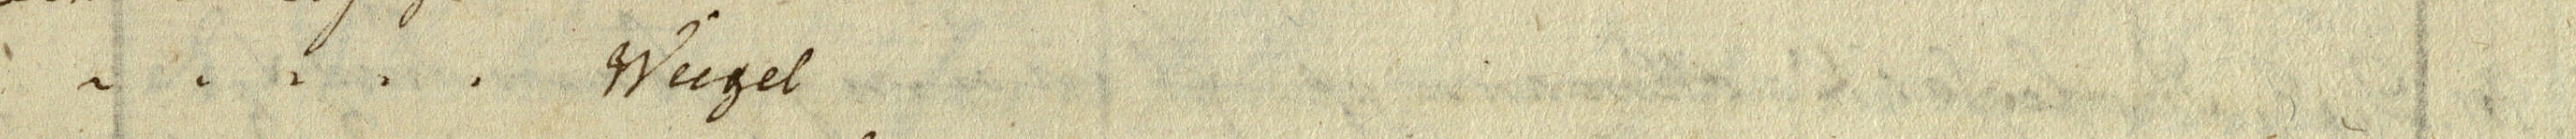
Weigel
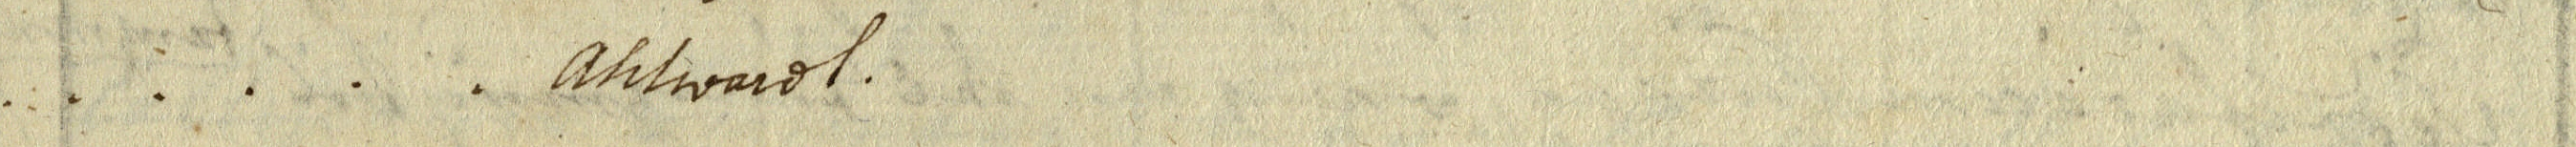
Ahlwardt.
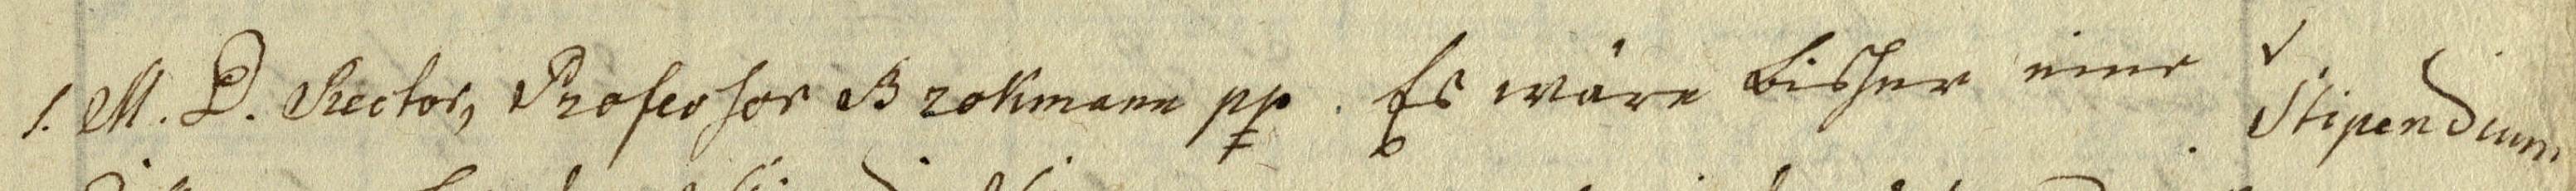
1. M. D. Rector, Professor Brokmann pp. Es wäre bisher eine Stipendium
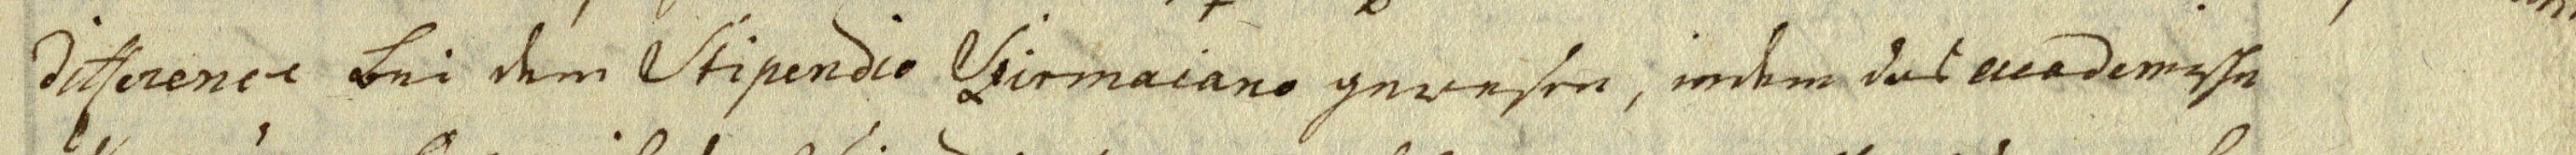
difference bei dem Stipendio Szirmaiano gewesen, indem das academische
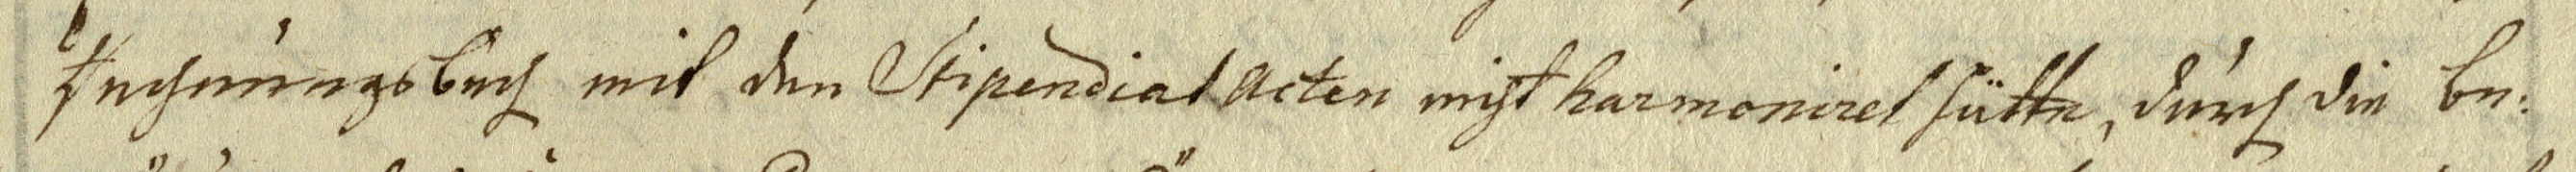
Rechnungsbuch mit den Stipendiatacten nicht harmoniret hätte, durch die Be¬
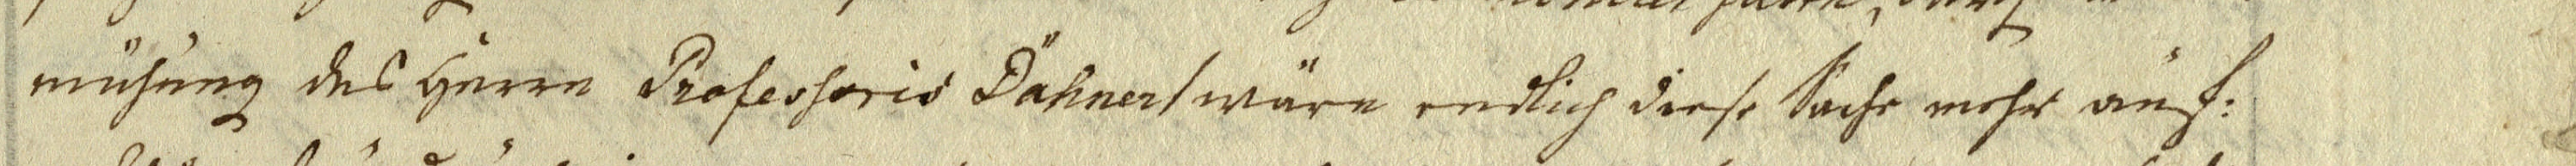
mühung des Herrn Professoris Dähnert wäre endlich diese Sache mehr auf¬
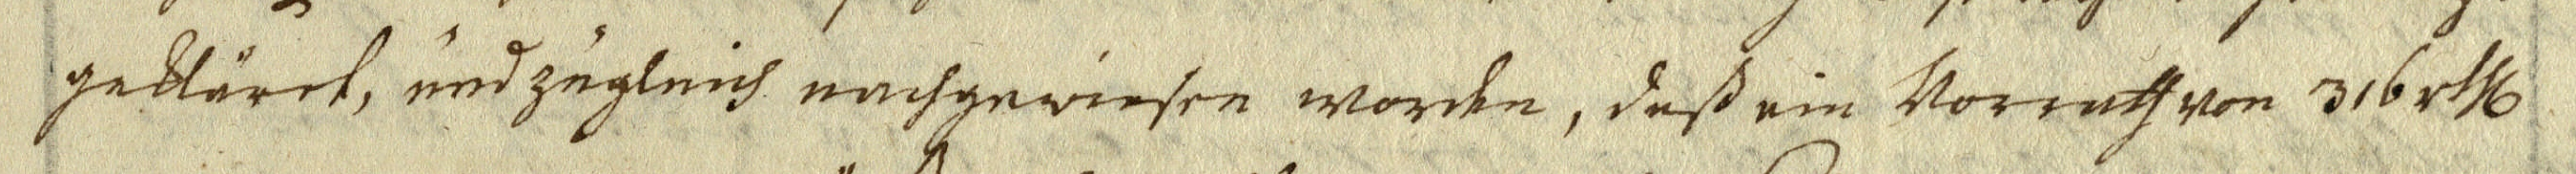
gekläret, und zugleich nachgewiesen worden, daß ein Vorrath von 316 rt
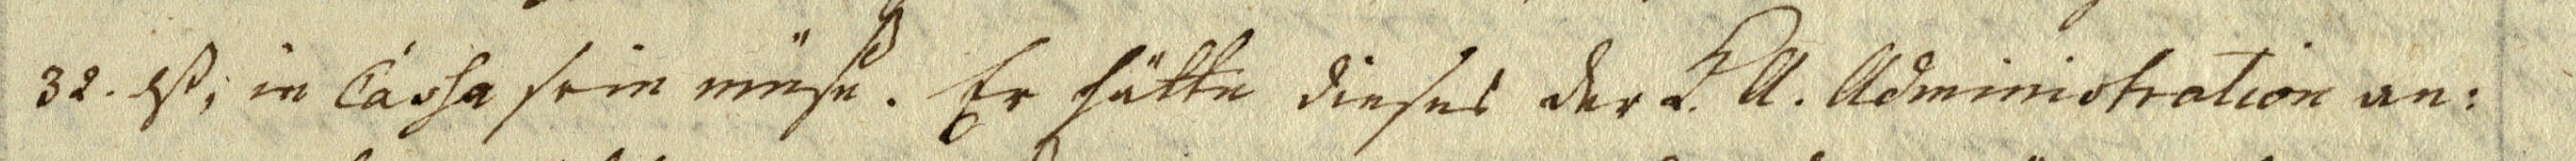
32. s. in Cassa sein müße. Er hätte dieses der K. A. Administration an¬
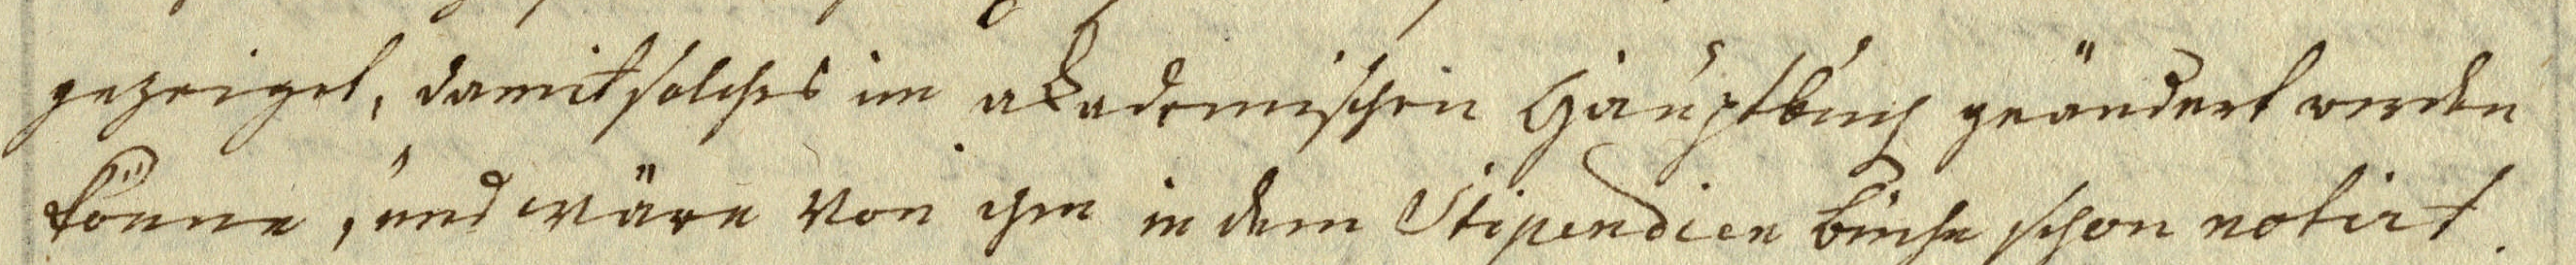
gezeiget, damit solches im akademischen Hauptbuch geändert werden
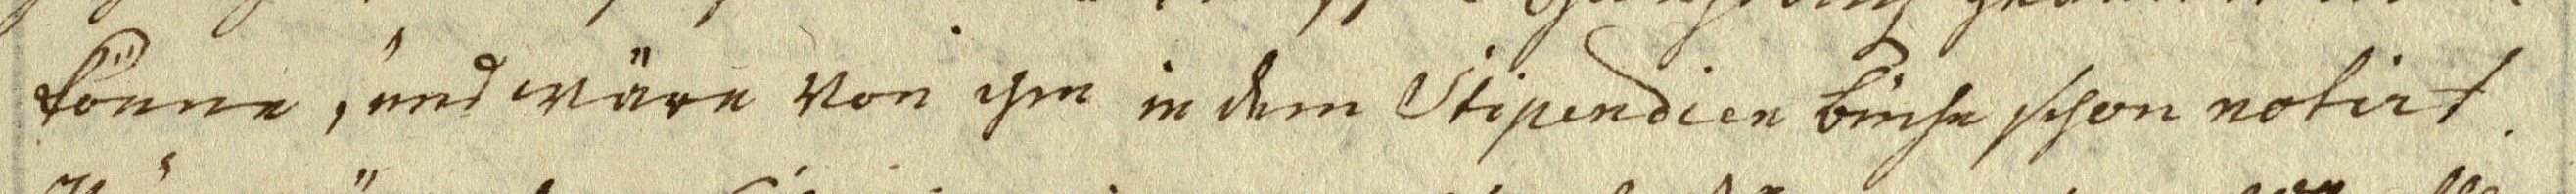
könne, und wäre von ihm in dem Stipendien Buche schon notirt.
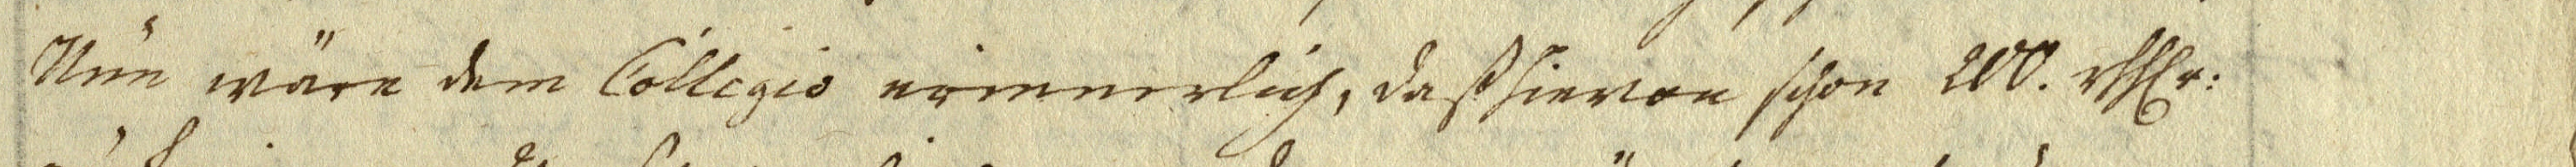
Nun wäre dem Collegio erinnerlich, daß hievon schon 200. rt:
